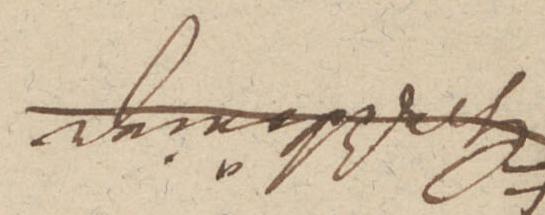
späteren Zeit ist
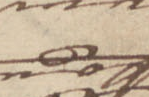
als die des
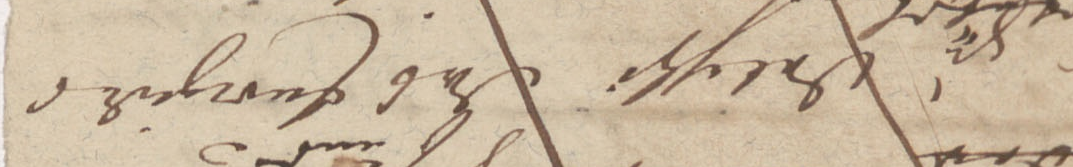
derartige im Religionswesen und
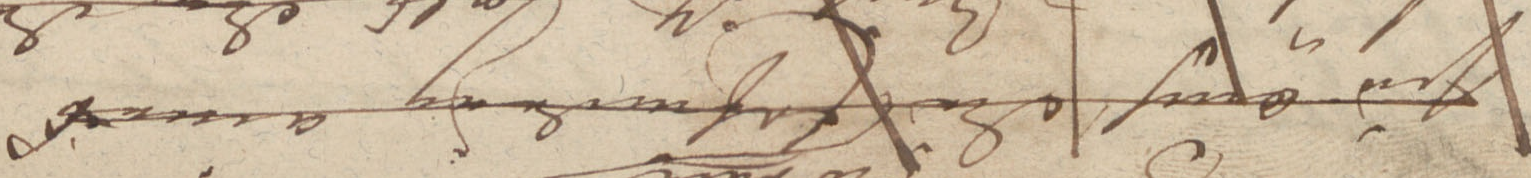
seine Nachfolger für sich und
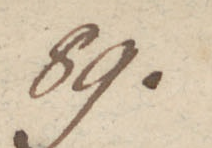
89.
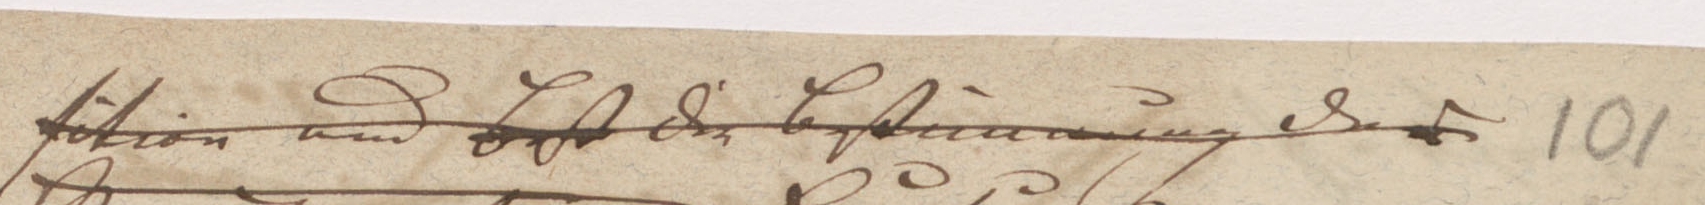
sition und Best de Bestimmung der
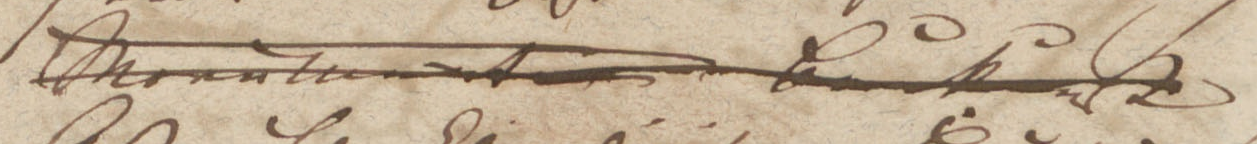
Monument Baukunst
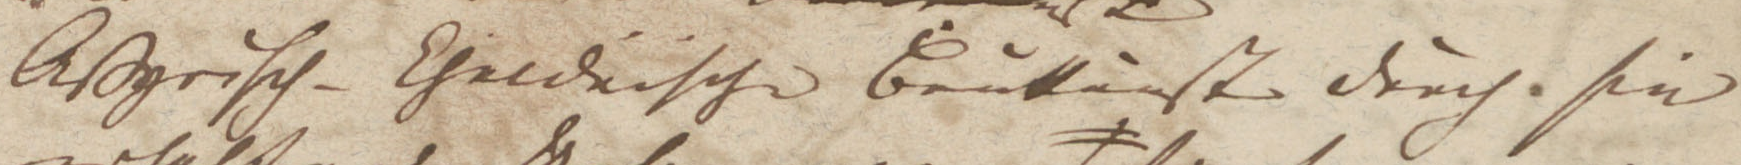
Assyrisch-Chaldäische Baukunst durch sie
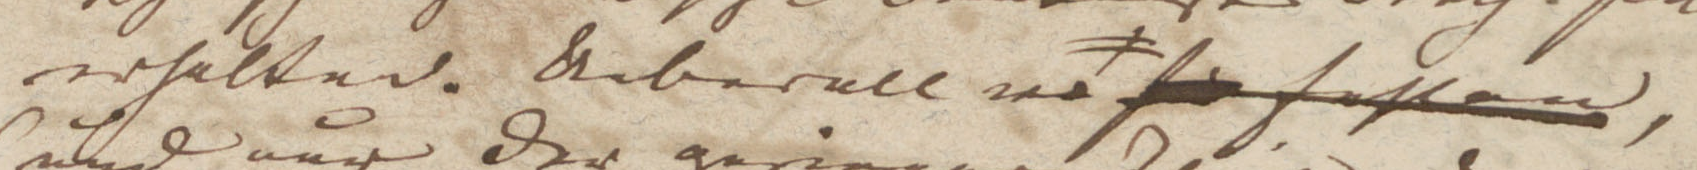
erhlalten. Ueberall wo sie fehlen %,
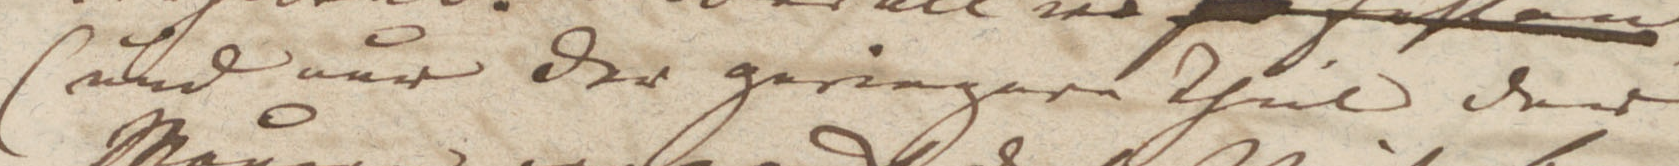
(und nur der geringere Theil der
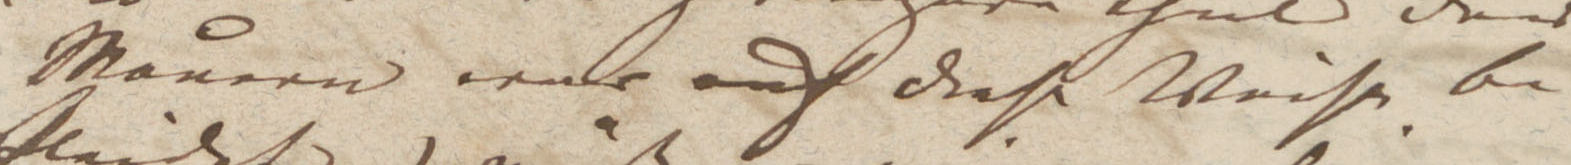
Mauern war auf diese Weise be-
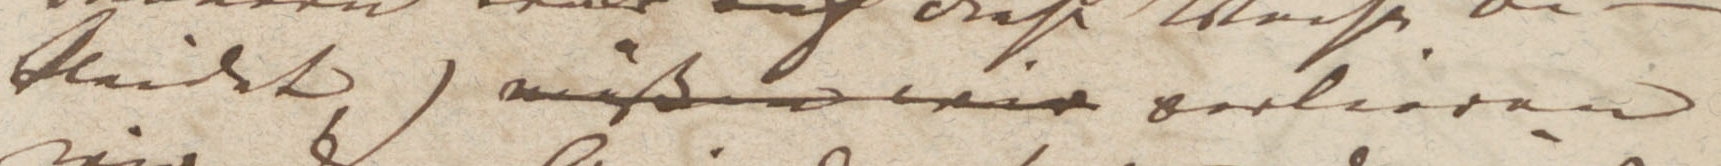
kleidet,) müssen wir verlieren
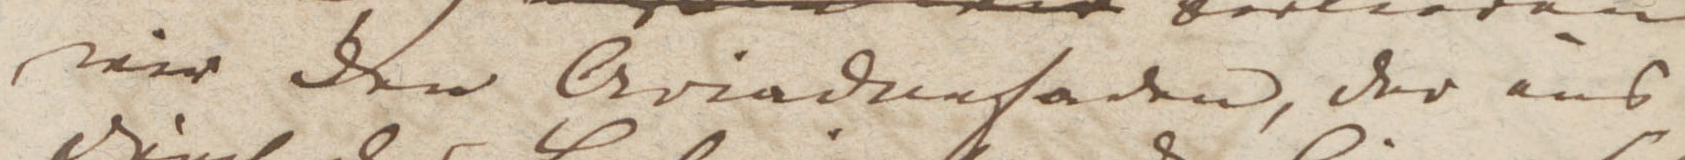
wir den Ariadnefaden, der uns
